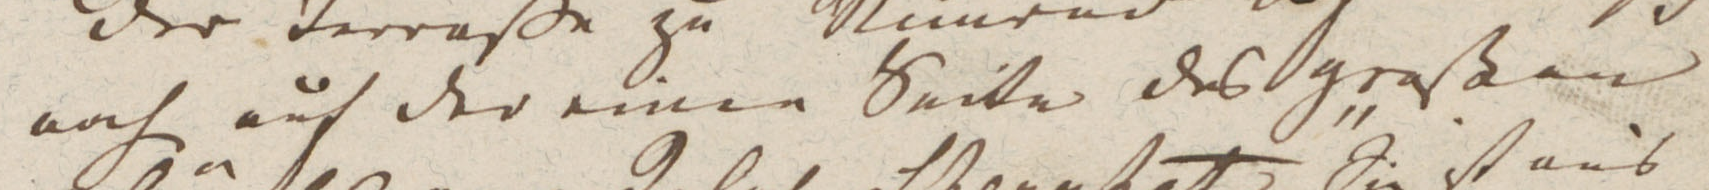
noch auf der einen Seite des grossen
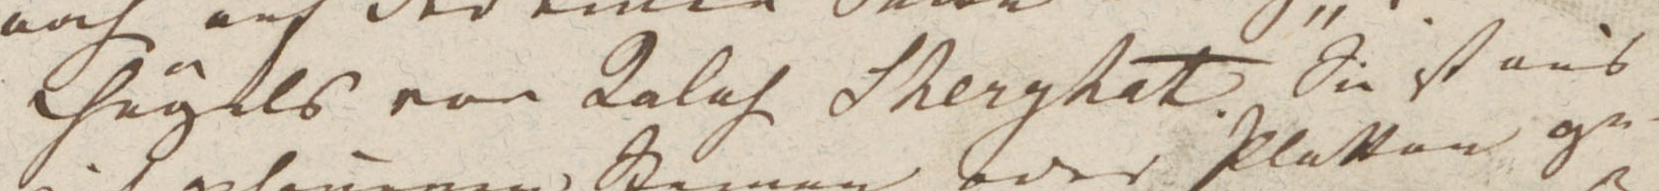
Hügels von Kalah Sherghat. Sie ist aus
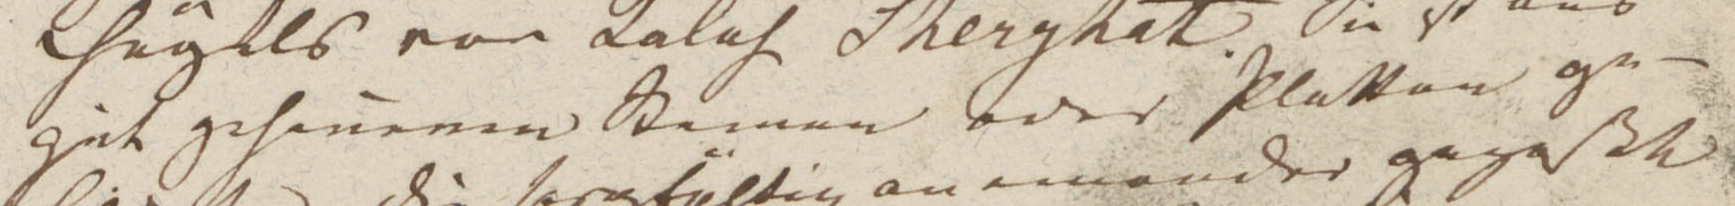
gut gehauenen Steinen oder Platten ge-
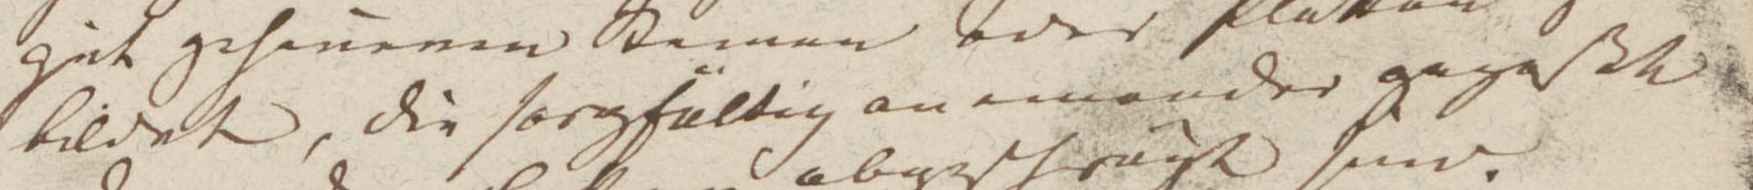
bildet, die sorgfältig an einander gepasst
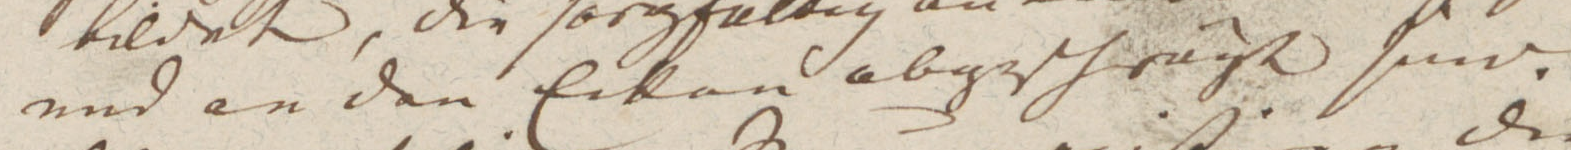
und an den Ecken abgeschrägt sind.
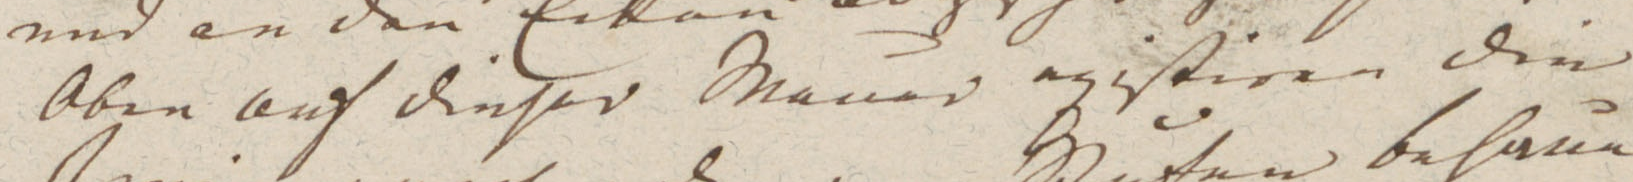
Oben auf dieser Mauer existiren die
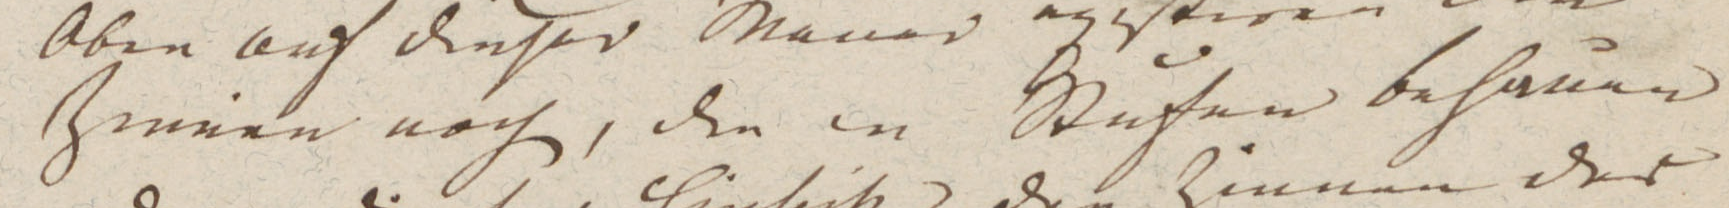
Zinnen noch, die in Stufen behauen
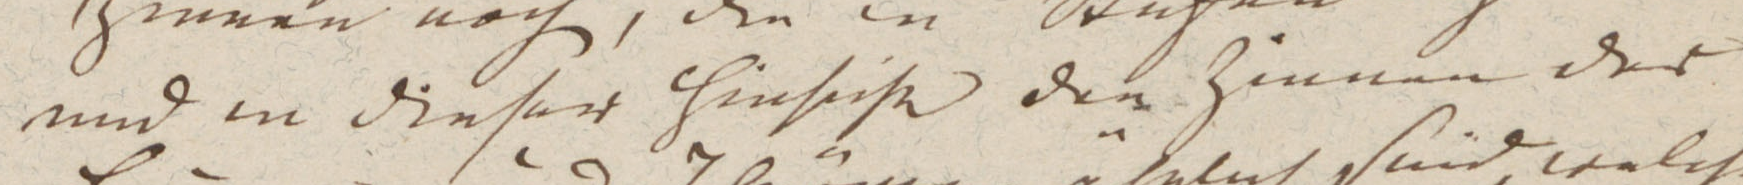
und in dieser Hinsicht den Zinnen der
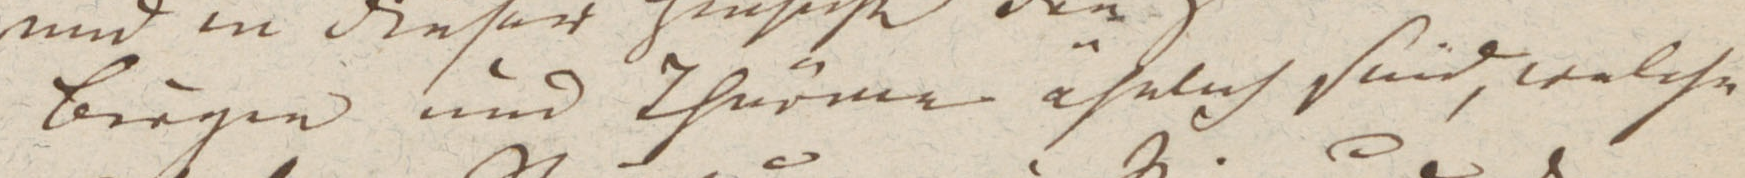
Burgen und Thürme ähnlich sind, welche
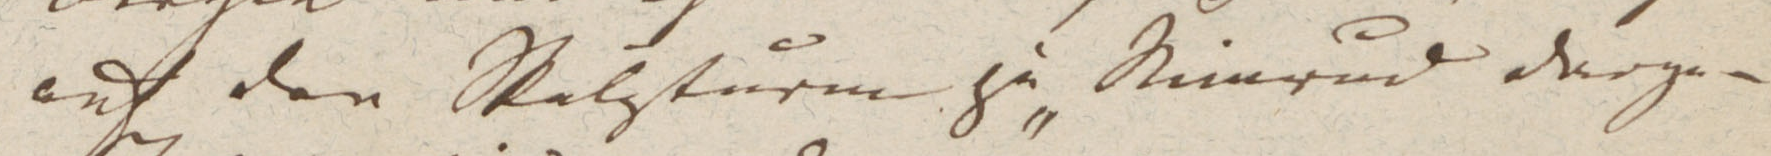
auf den Skulpturen zu Nimrud darge-
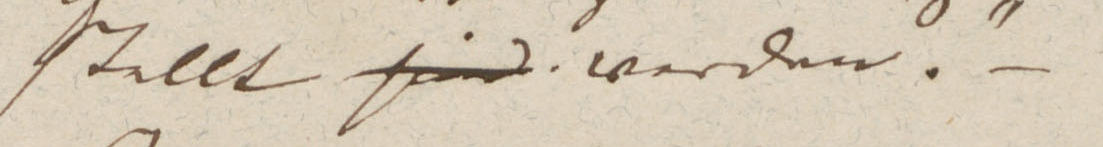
stellt sind. werden." –
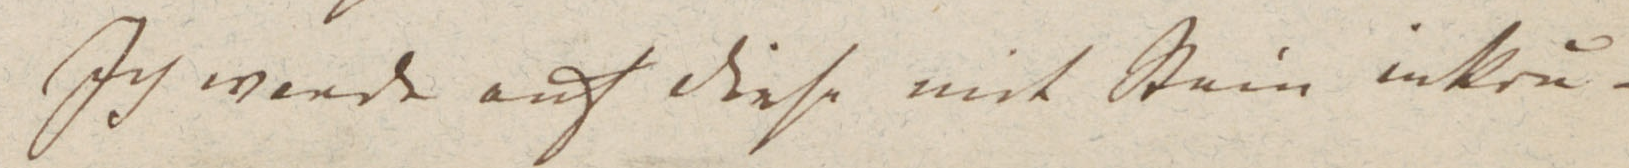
Ich werde auf diese mit Stein inkru-
